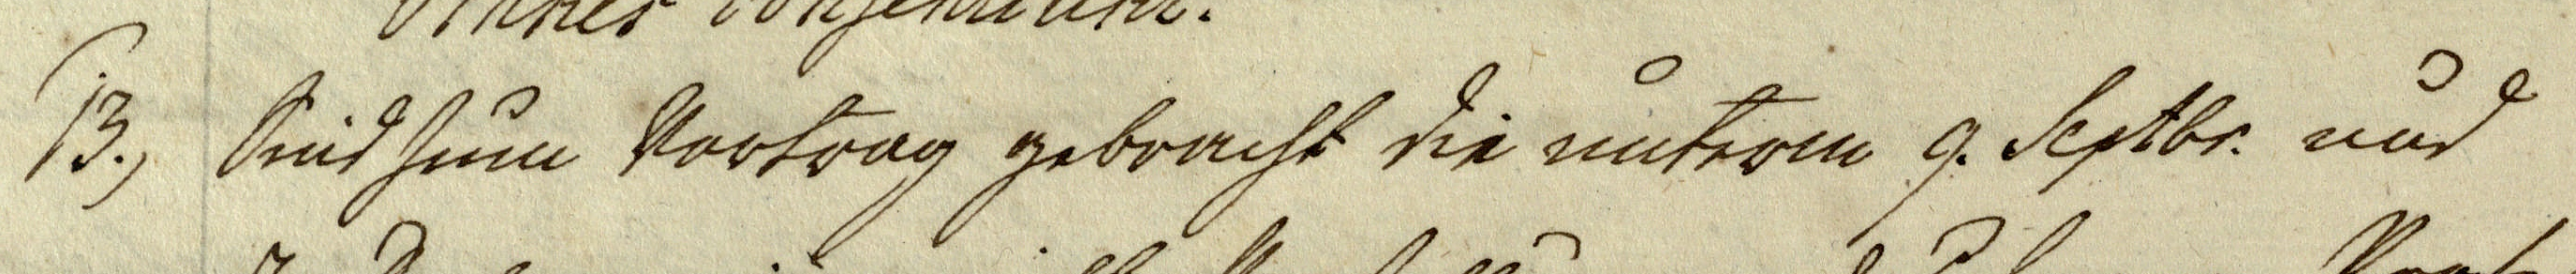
13., Sind zum Vortrag gebracht die unterm 9. Septbr. und
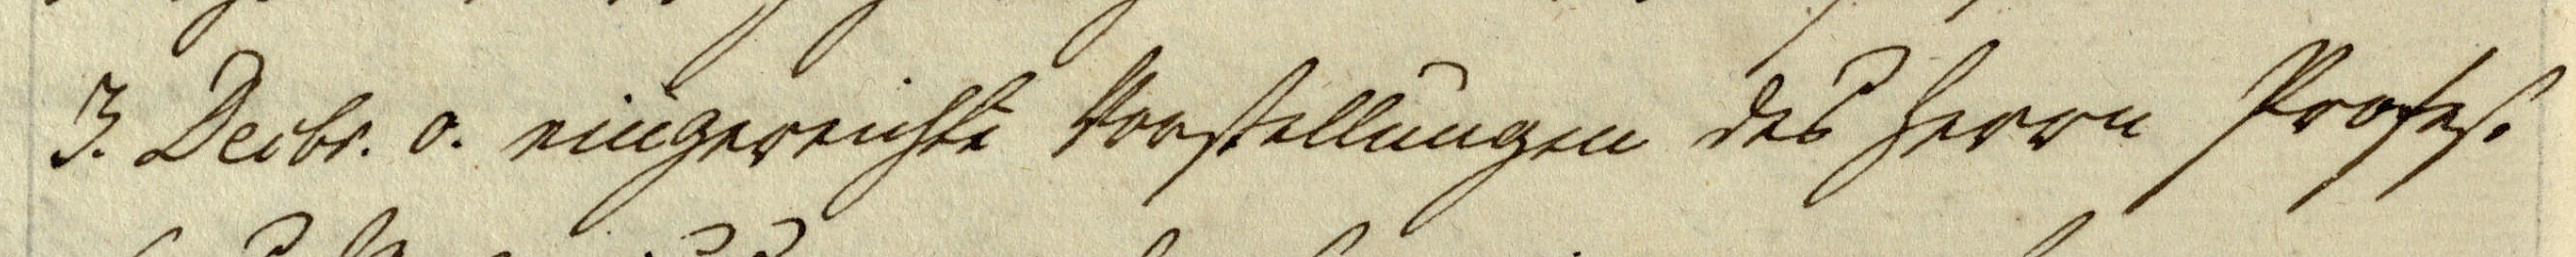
3. Decbr. c. eingereichte Vorstellungen des Herrn Profes¬
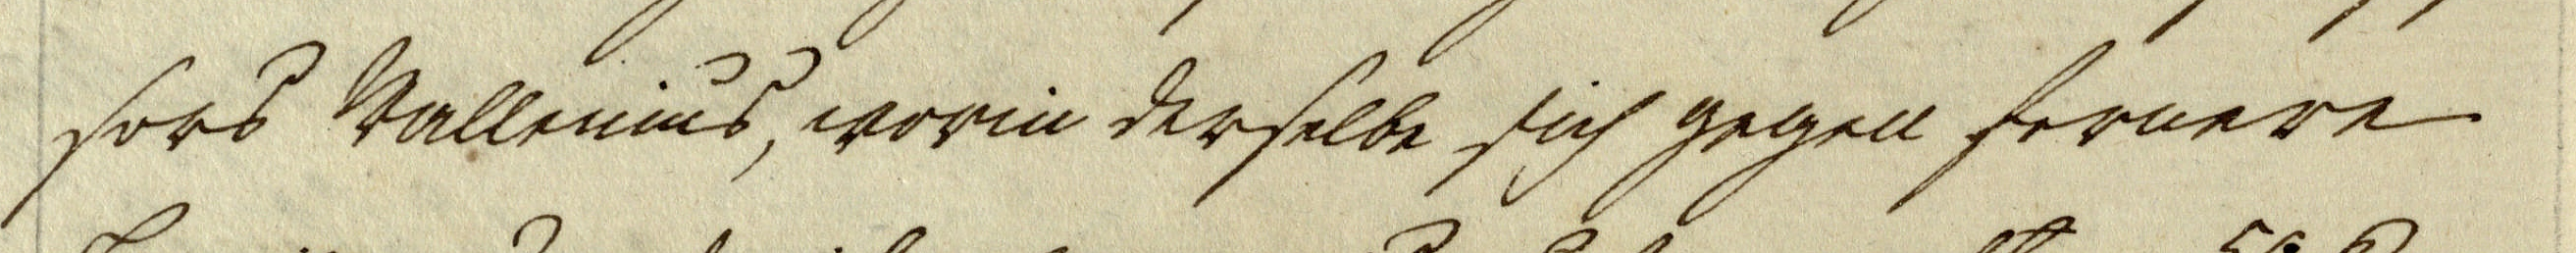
sors Wallenius, worin derselbe sich gegen fernere
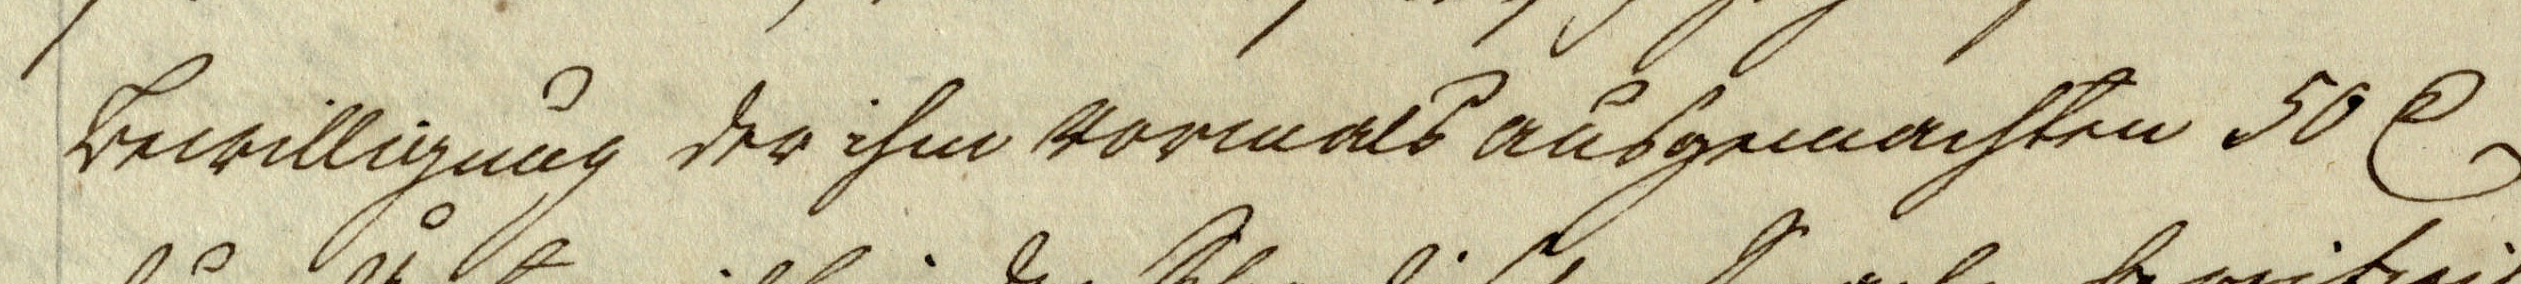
Bewilligung der ihm vormals ausgemachten 50 l.
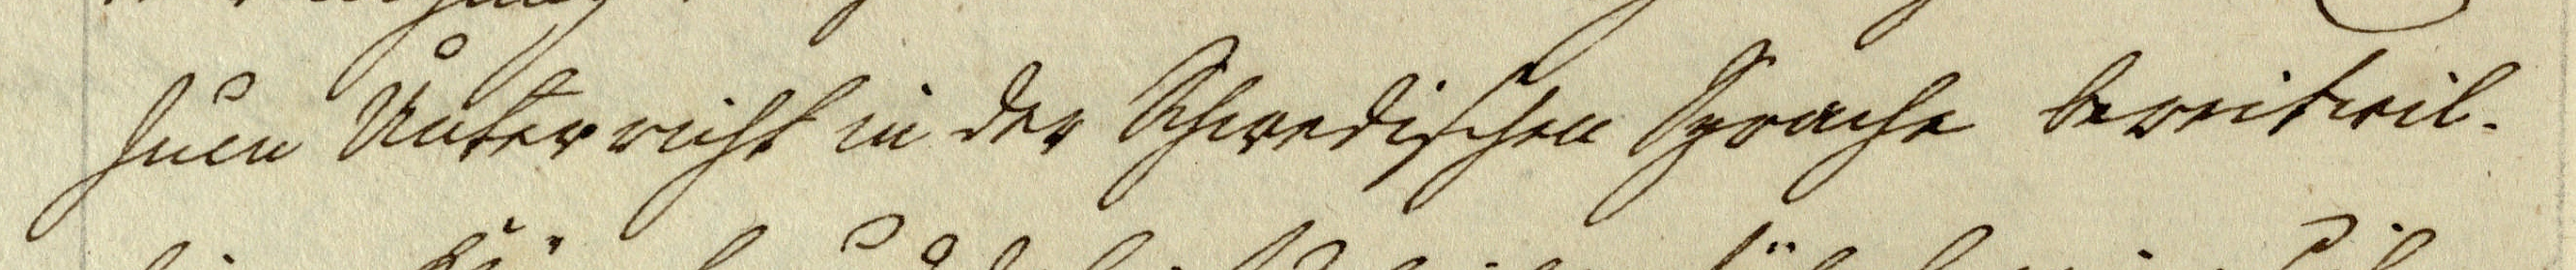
zum Unterricht in der Schwedischen Sprache bereitwil¬
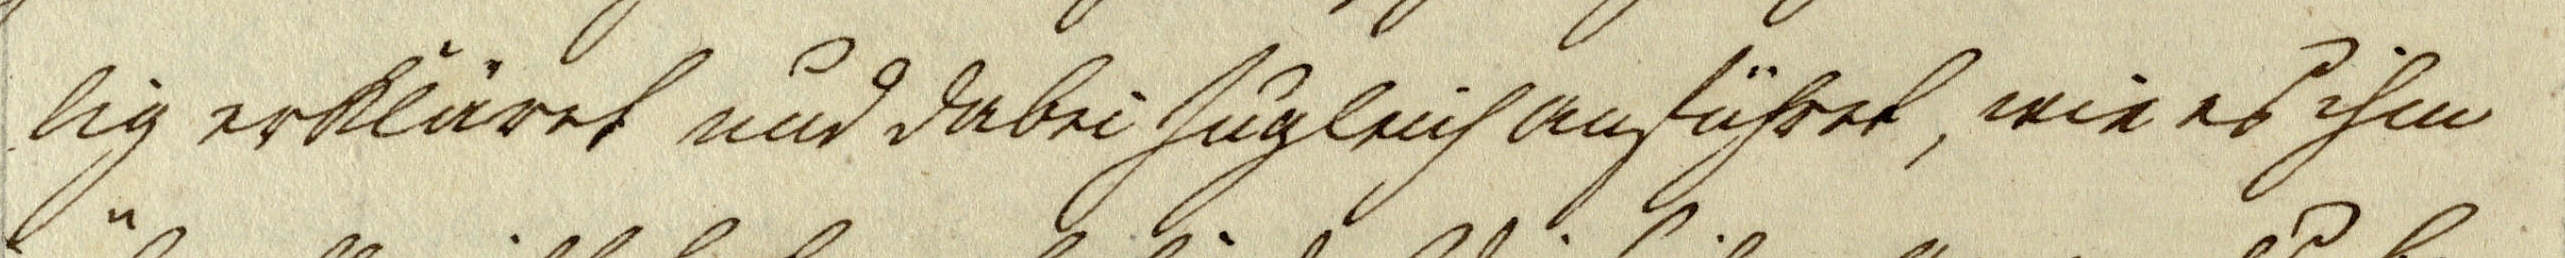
lig erkläret und dabei zugleich anführet, wie es ihm
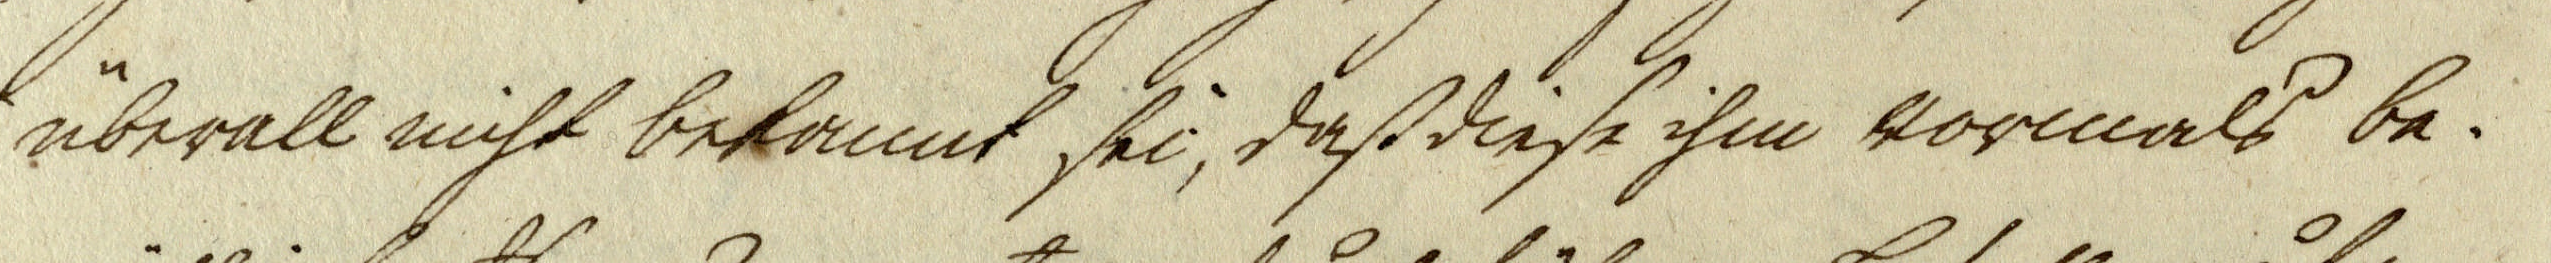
überall nicht bekannt sei, daß diese ihm vormals be¬
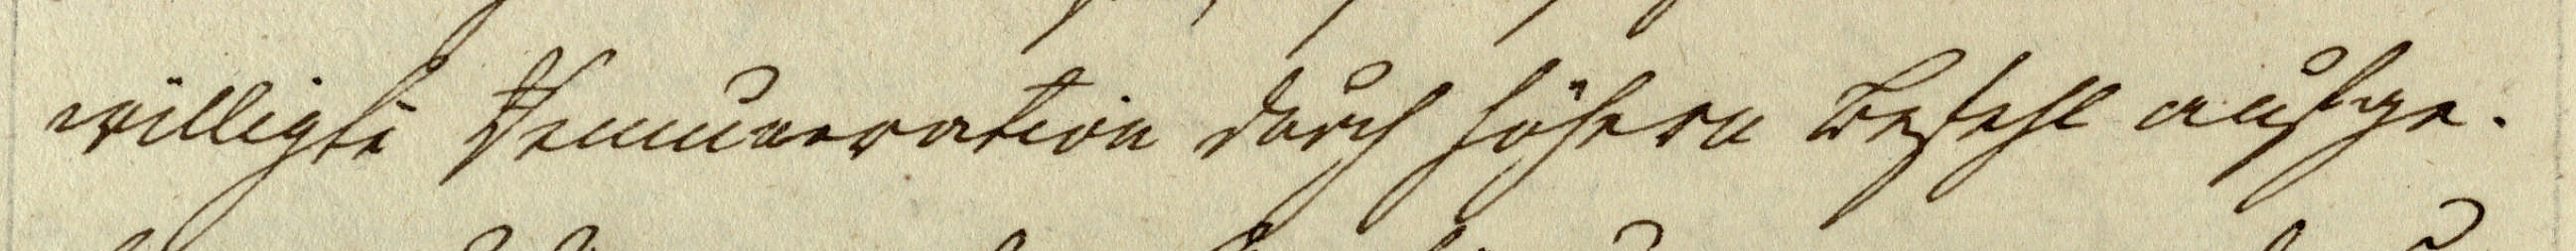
wiligte Remuneration durch höhern Befehl aufge¬
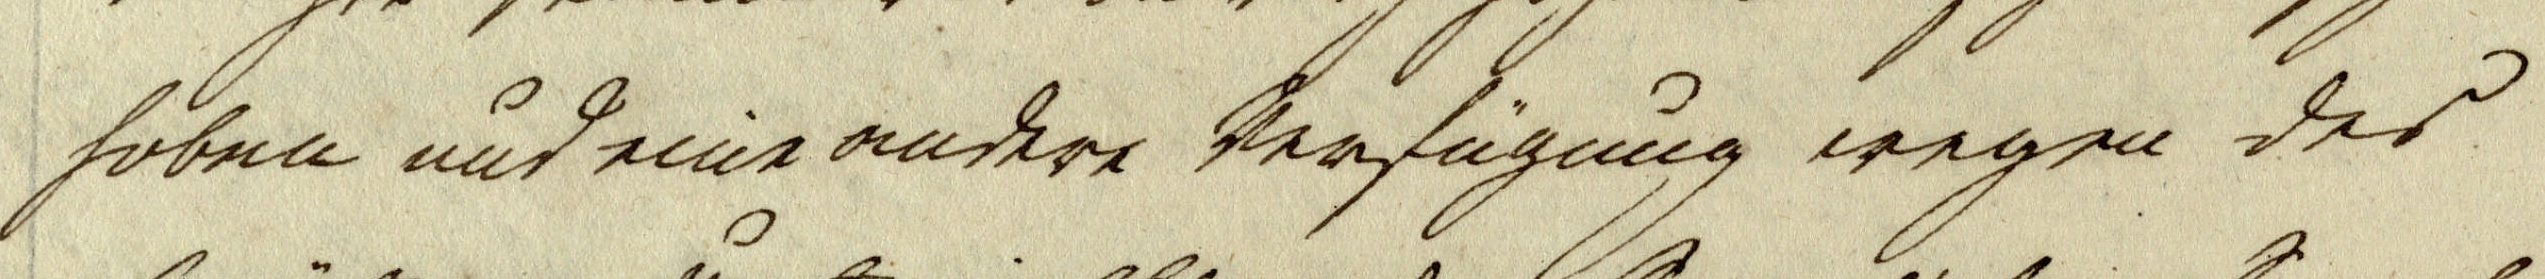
hoben und eine andere Verfügung wegen des
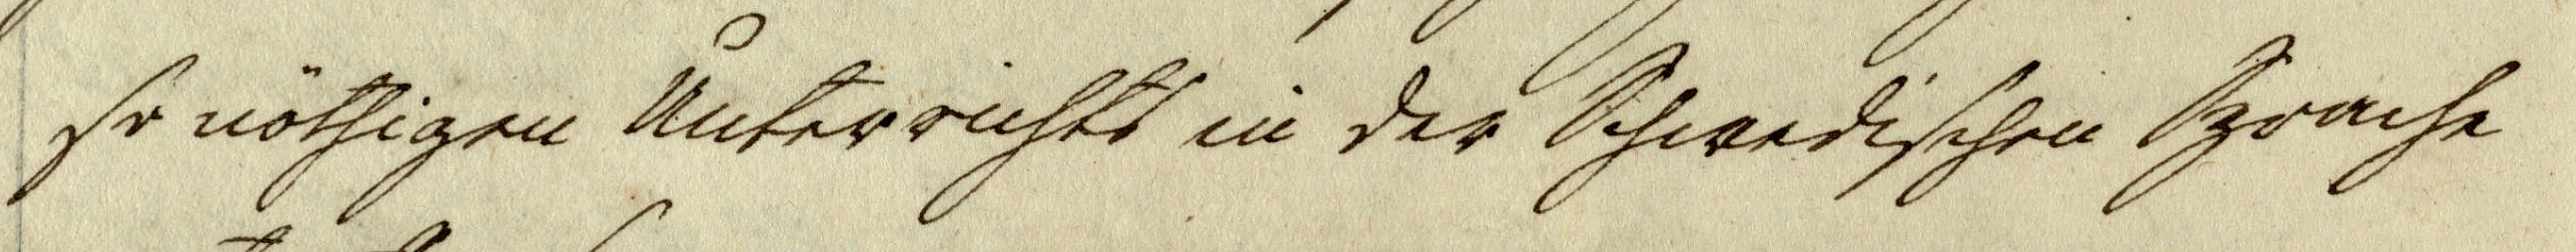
so nöthigen Unterrichts in der Schwedischen Sprache
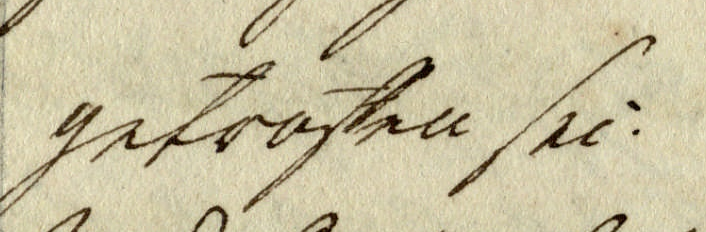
getroffen sei.
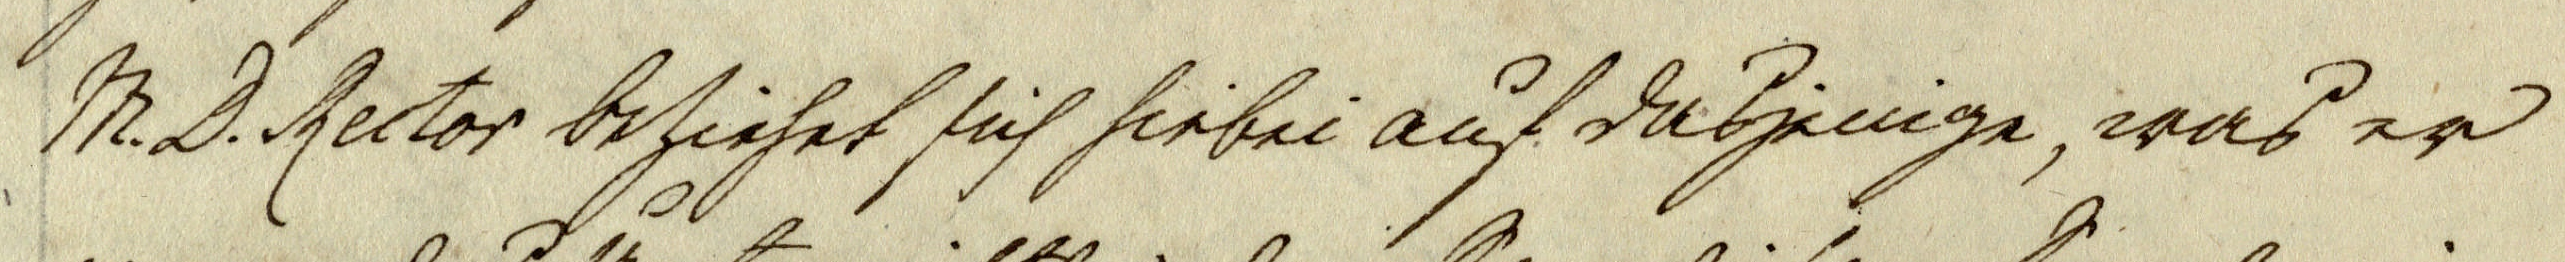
M. D. Rector beziehet sich hiebei auf dasjenige, was er
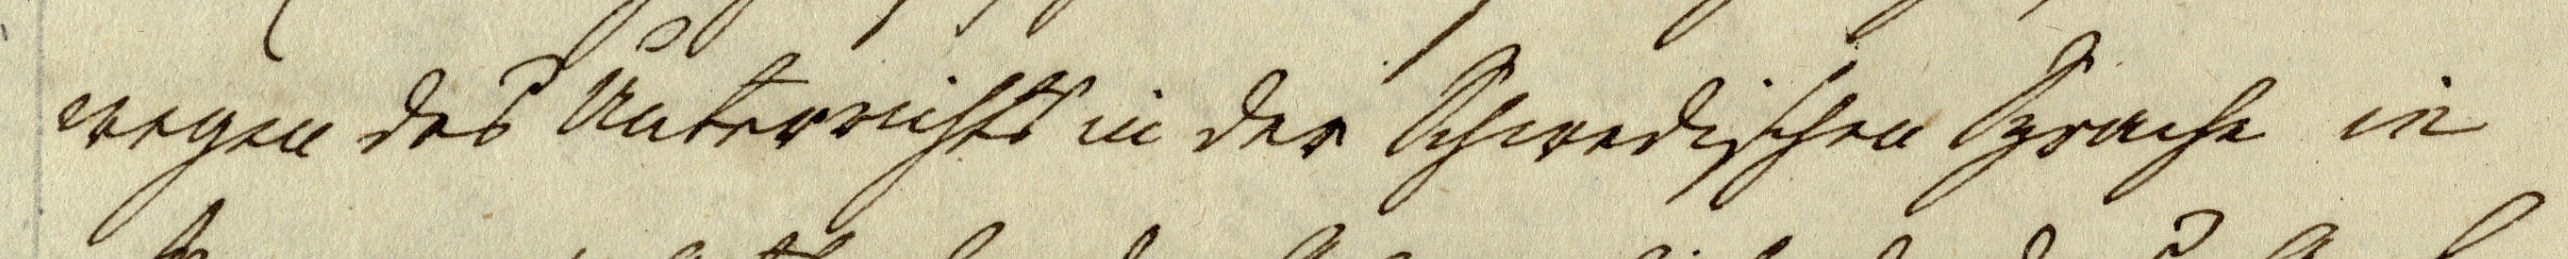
wegen des Unterrichts in der Schwedischen Sprache in
